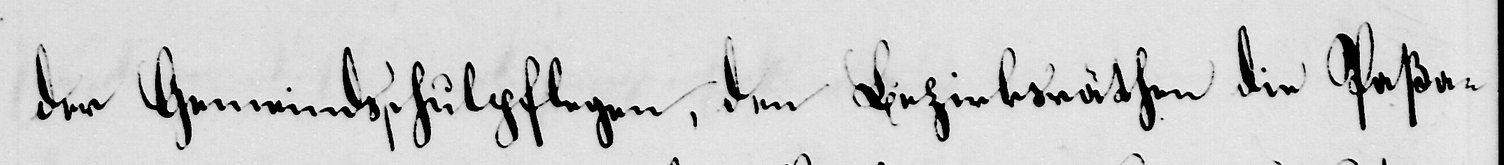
der Gemeindsschulpflegen, den Bezirksräthen die Paßa¬
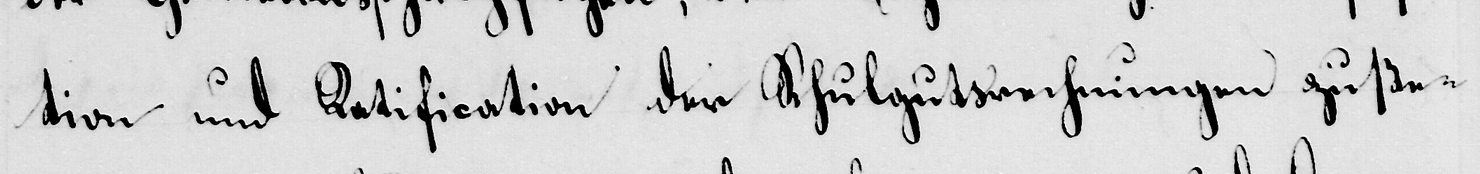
tion und Ratification der Schulgutsrechnungen zuste¬
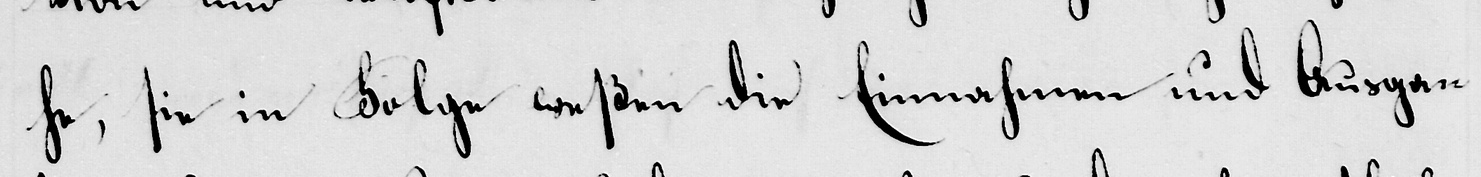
he, sie in Folge weßen die Einnahmen und Ausga¬
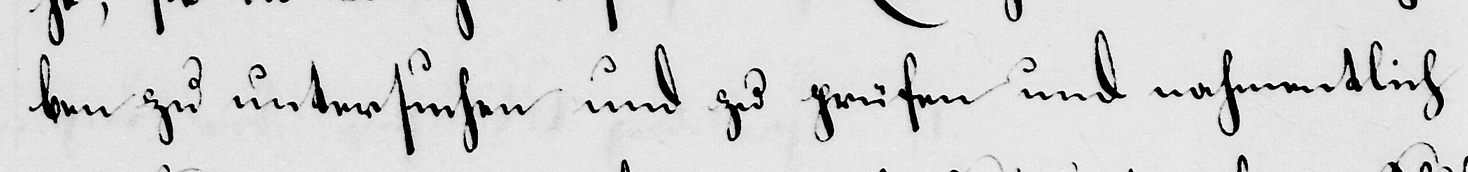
ben zu untersuchen und zu prüfen und nahmentlich
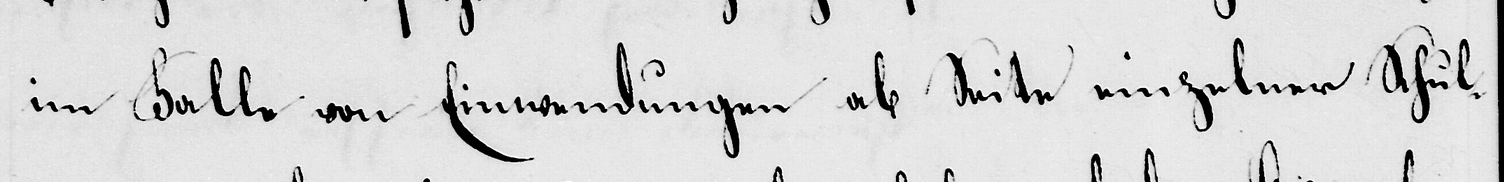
im Falle von Einwendungen ab Seite einzelner Schul¬
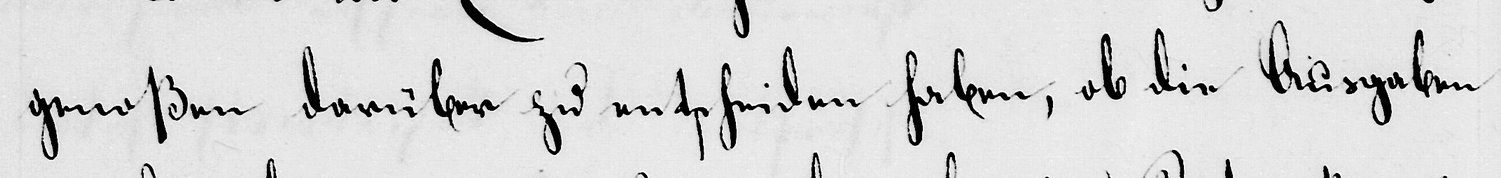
genoßen darüber zu entscheiden haben, ob die Ausgaben
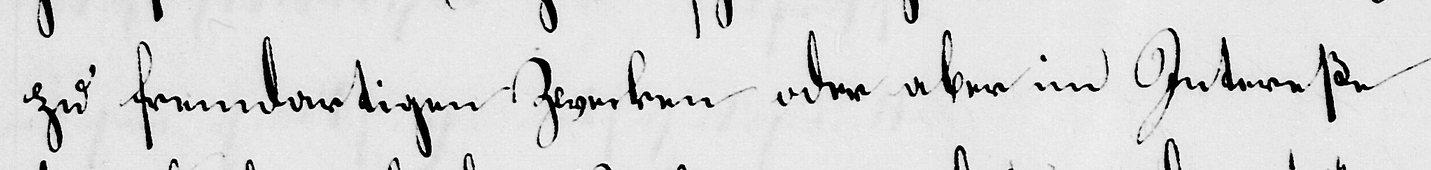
zu fremdartigen Zwecken oder aber im Intereße
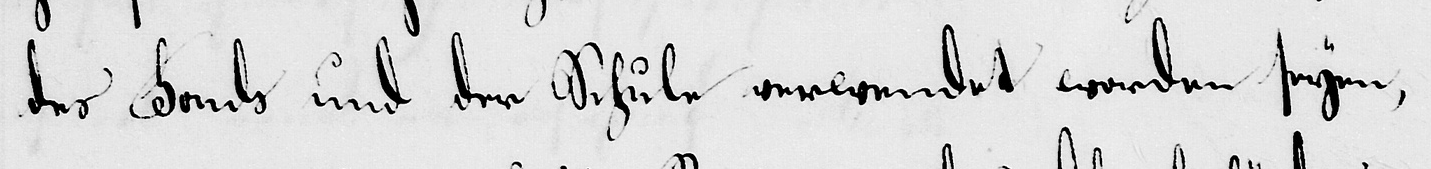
des Fonds und der Schule verwendet worden seyen,
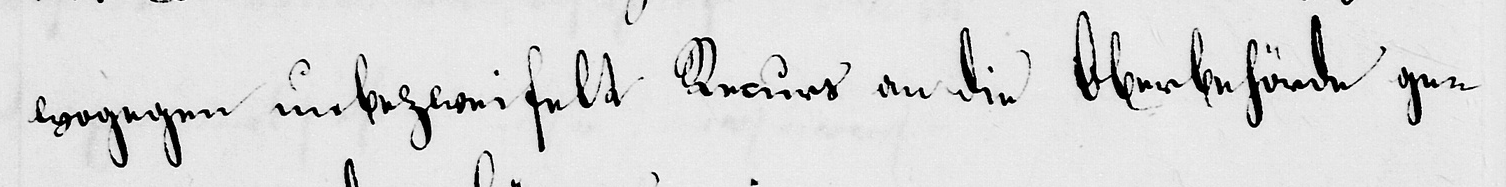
wogegen unbezweifelt Recurs an die Oberbehörde ge¬
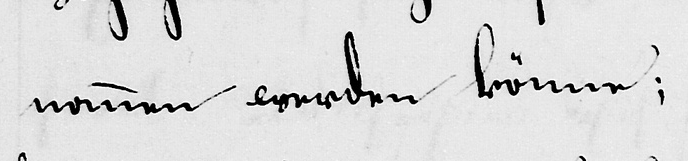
nommen werden könne;
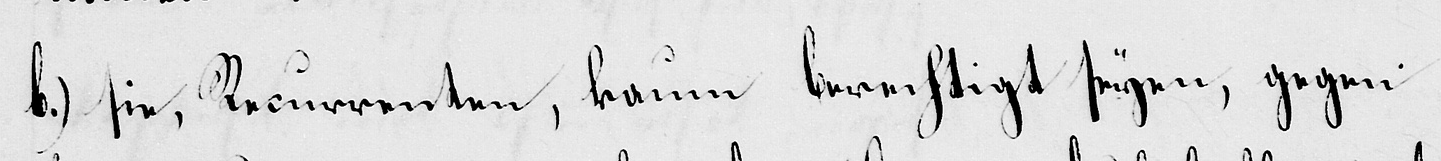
b.) sie, Recurrenten, kaum berechtigt seyen, gegen
